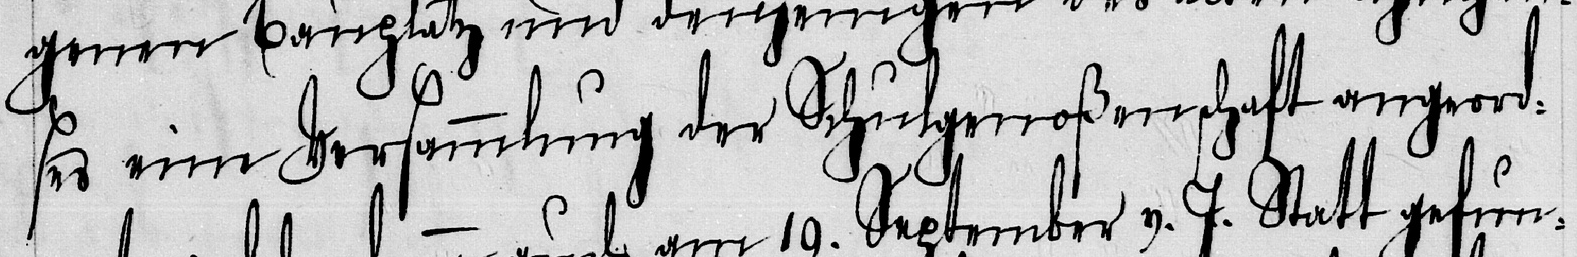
ses eine Versammlung der Schulgenoßenschaft angeord¬
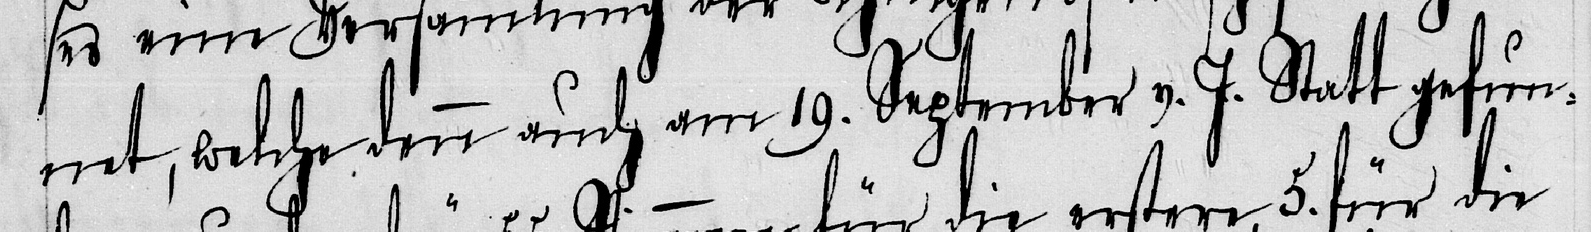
net, welche denn auch am 19. September v. J. Statt gefun¬
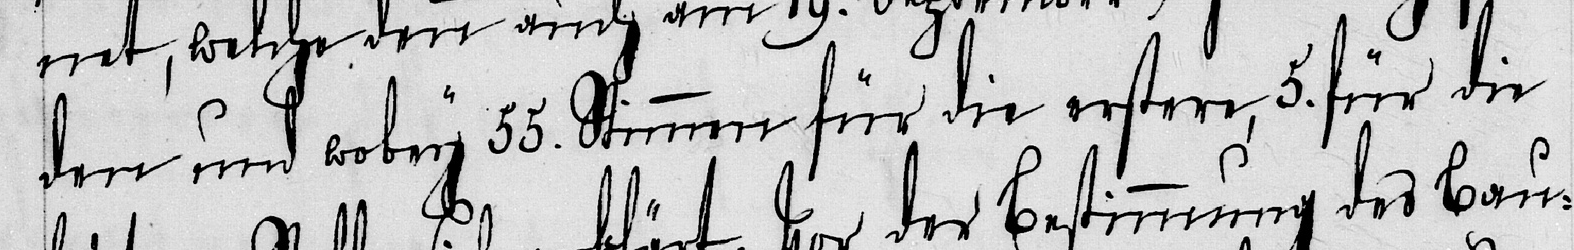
den und wobey 55. Stimmen für die erstere, 5. für die
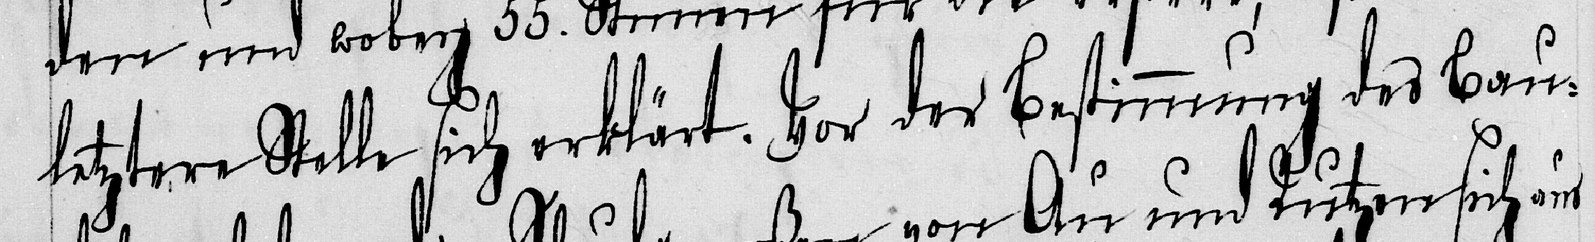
letztere Stelle sich erklärt. Vor der Bestimmung des Bau¬
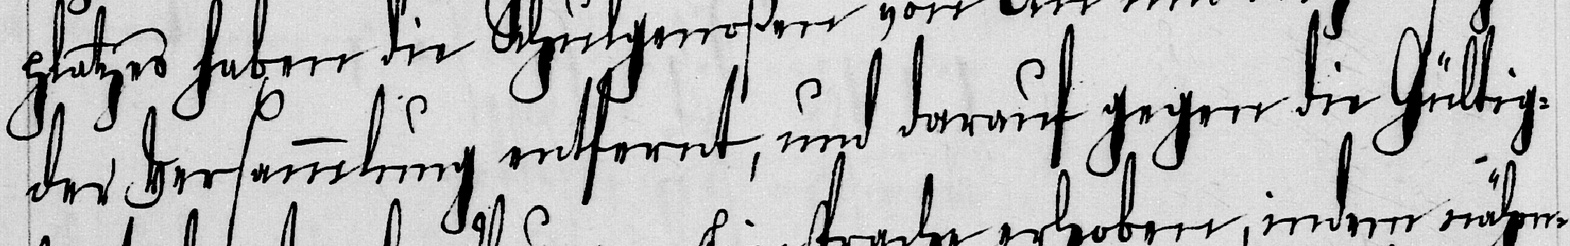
der Versammlung entfernt, und darauf gegen die Gültig¬
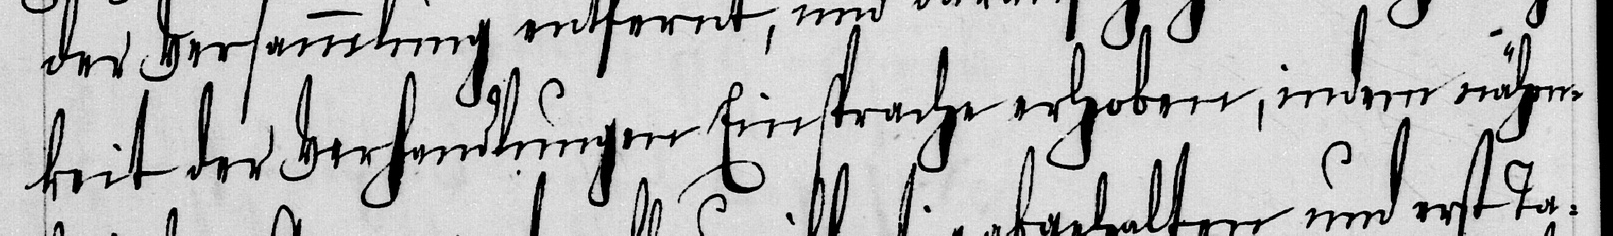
keit der Versammlungen Einsprache erhoben, indem nähm¬
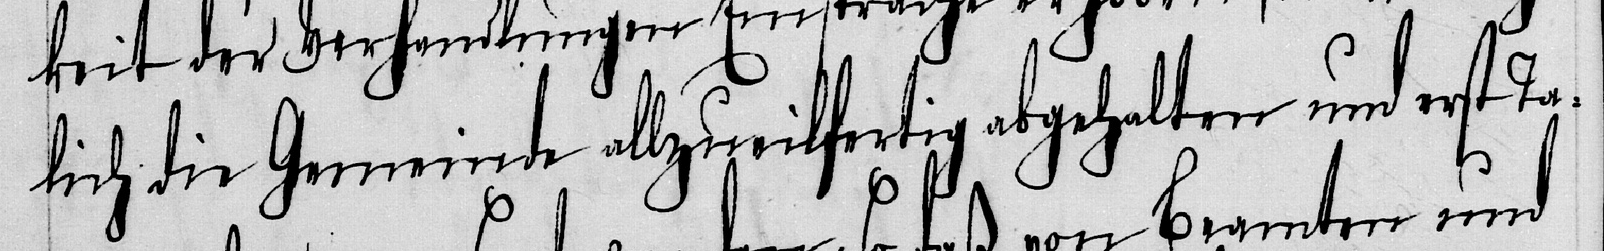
lich die Gemeinde allzu eilfertig abgehalten und erst Ta¬
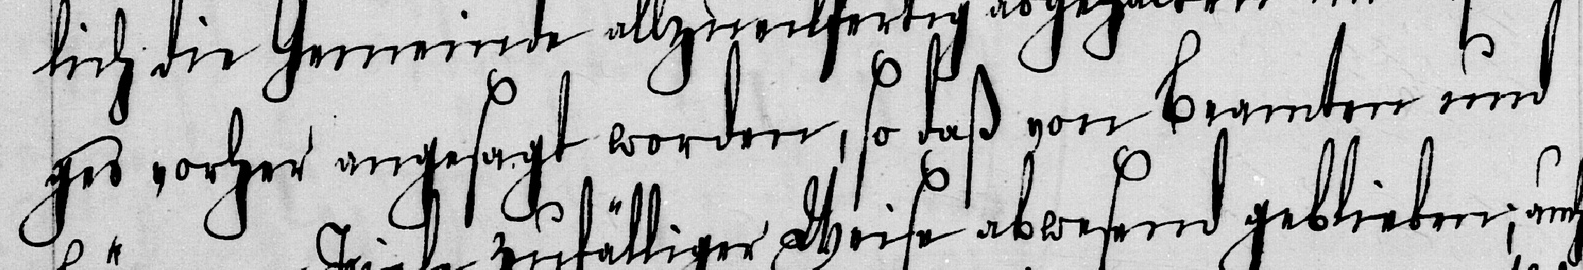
ges vorher angesagt worden, so daß Beamten und
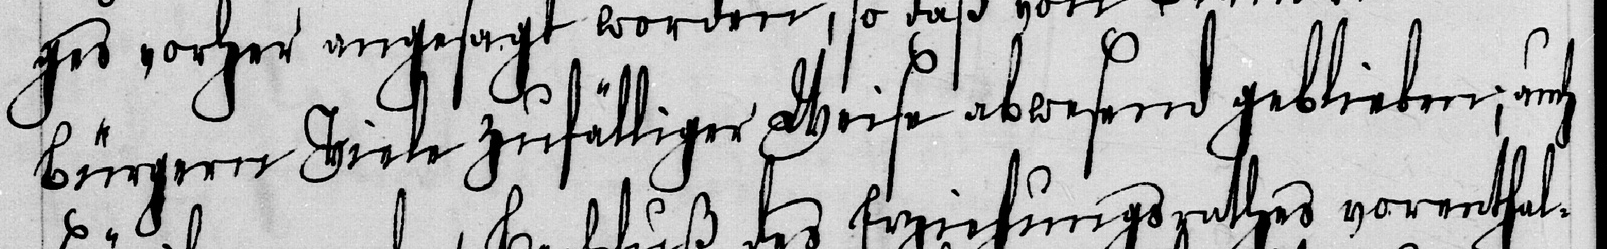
Bürgern viele zufälliger Weise abwesend geblieben; auch
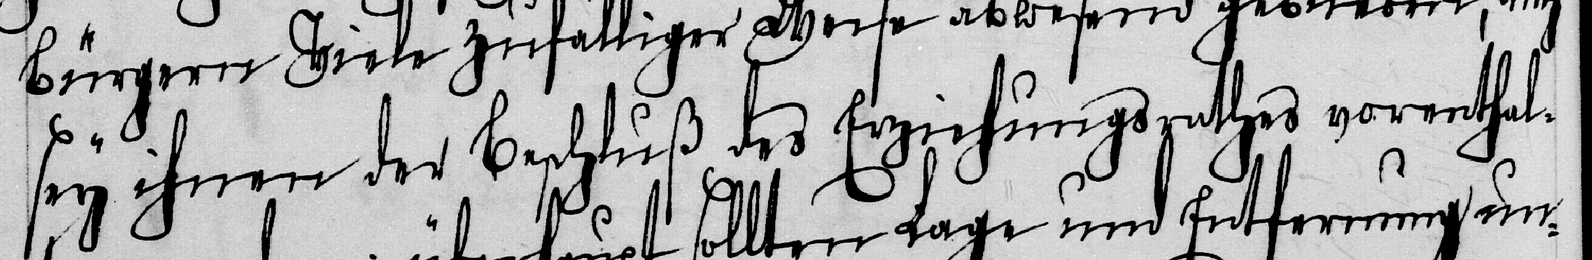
sey ihnen der Beschluß des Erziehungsrathes vorenthal¬
